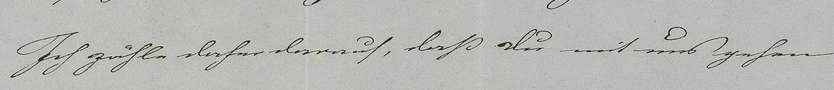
Ich zähle daher darauf, daß Du mit uns gehen
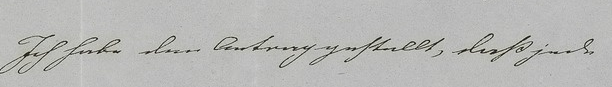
Ich habe den Antrag gestellt, daß jede
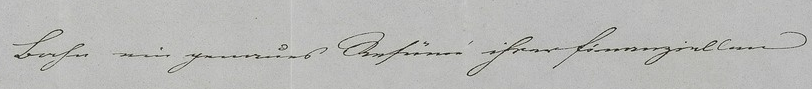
Bahn ein genaues Resümé ihrer finanziellen
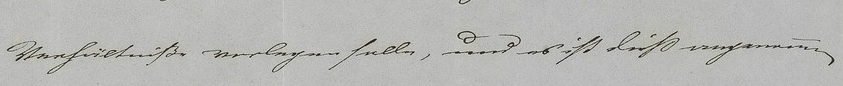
Verhältniße vorlegen solle, und es ist dieß angenommen
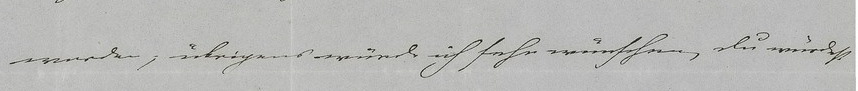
worden; übrigens würde ich sehr wünschen, du würdest
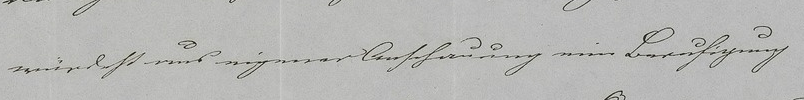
würdest aus eigener Anschauung eine Beruhigung
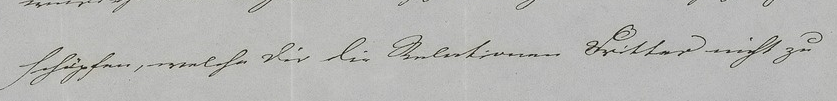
schöpfen, welche Dir die Relationen Dritter nicht zu
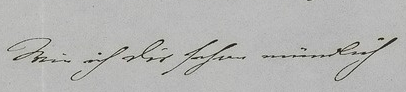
Wie ich Dir schon mündlich
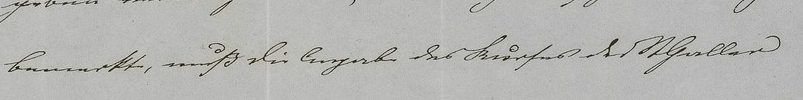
bemerkte, muß die Angabe des Kurses der St Galler
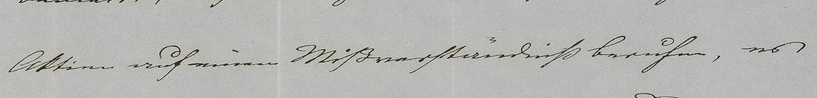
Aktien auf einem Mißverständniß beruhen, es
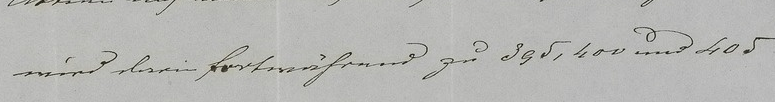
wird darin fortwährend zu 395, 400 und 405
